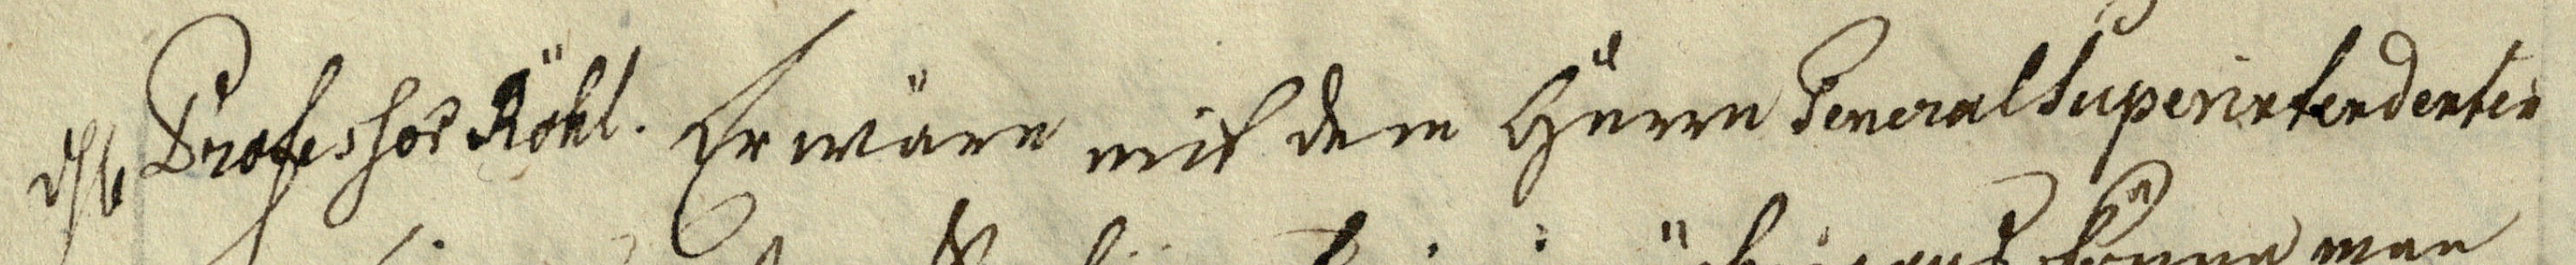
dh. Professor Röhl. Er wäre mit dem Herrn GeneralSuperintendenten
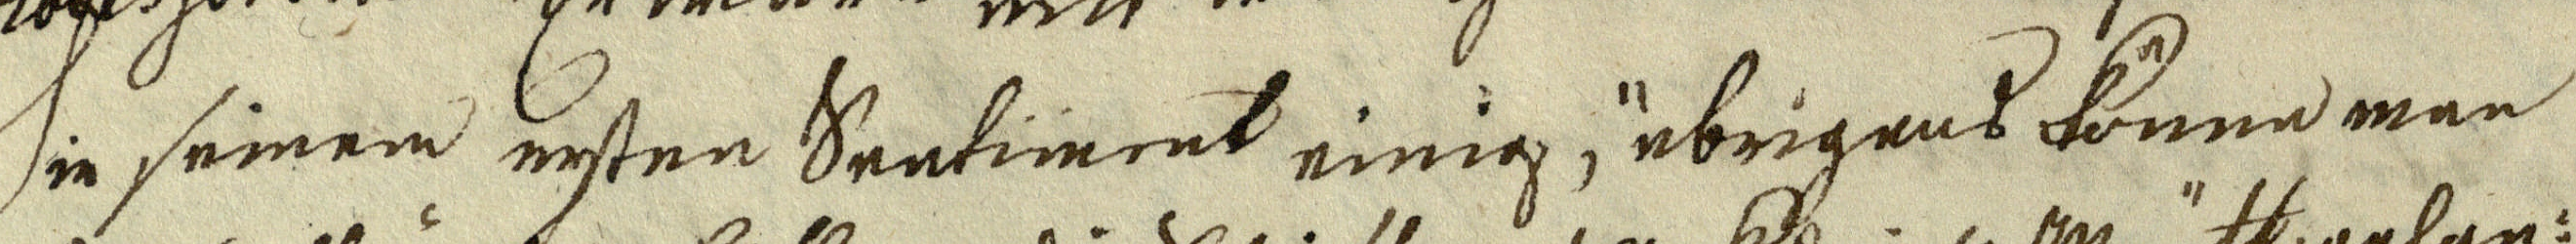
in seinem ersten Sentiment einig, übrigens könne man
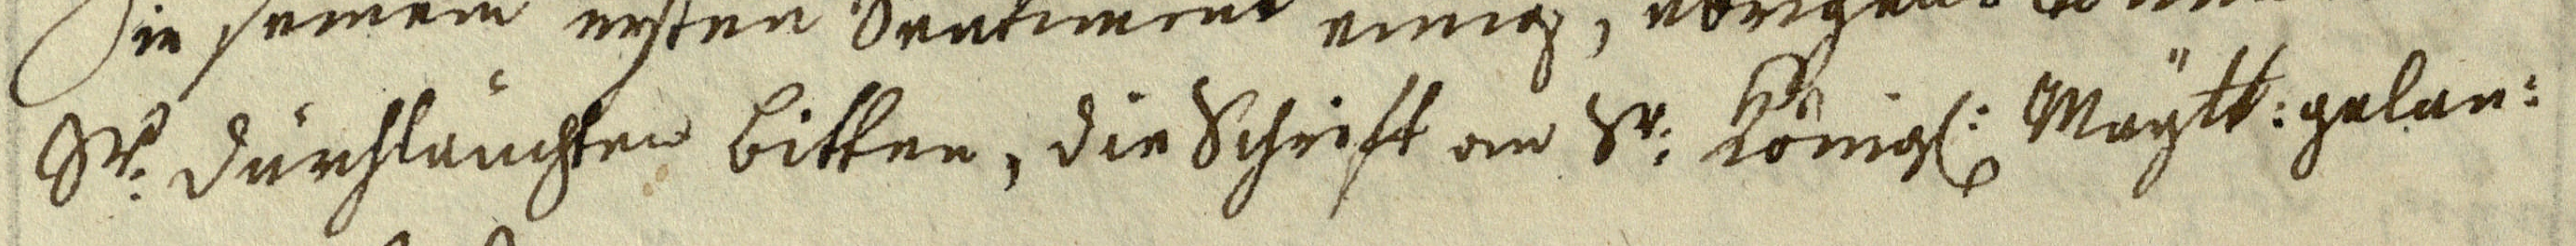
Sr Durchlauchten bitten, die Schrift an Sr. Königl. Maÿtt gelan¬
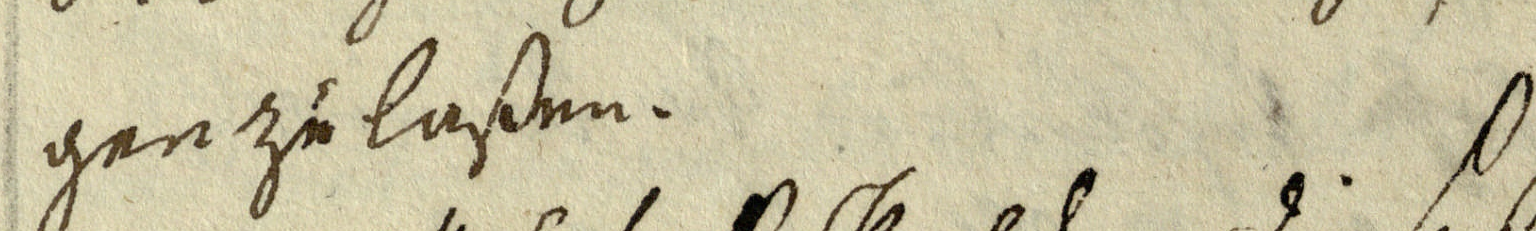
gen zu laßen.
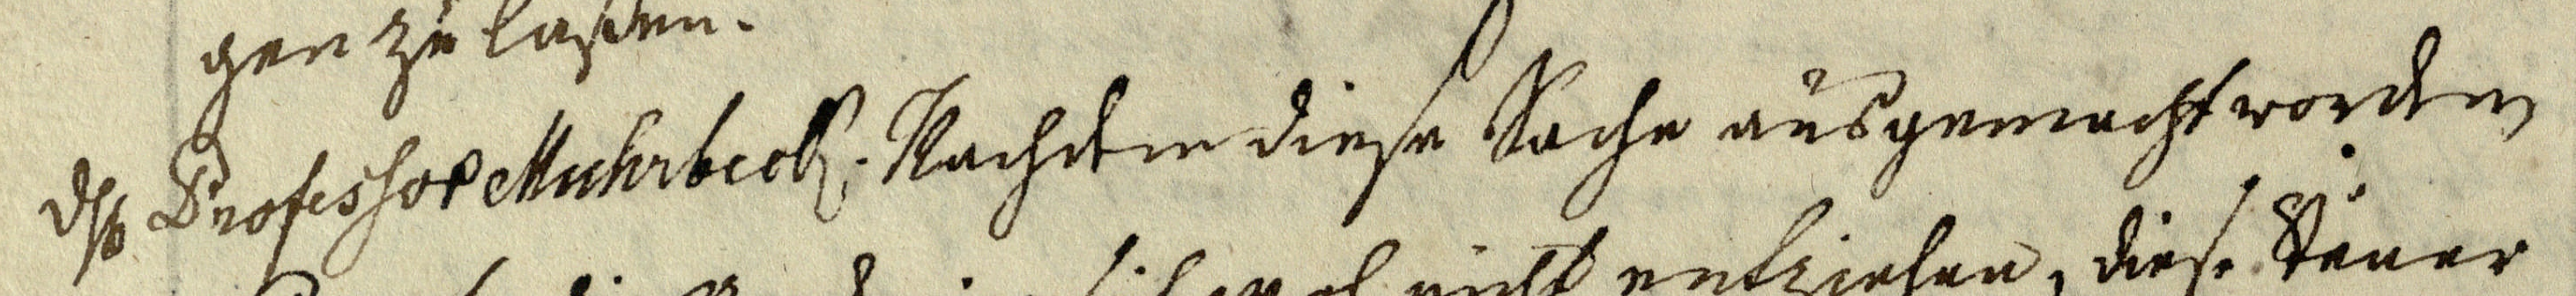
dh. Prof. Muhrbeck. Nachdem diese Sache ausgemacht worden,
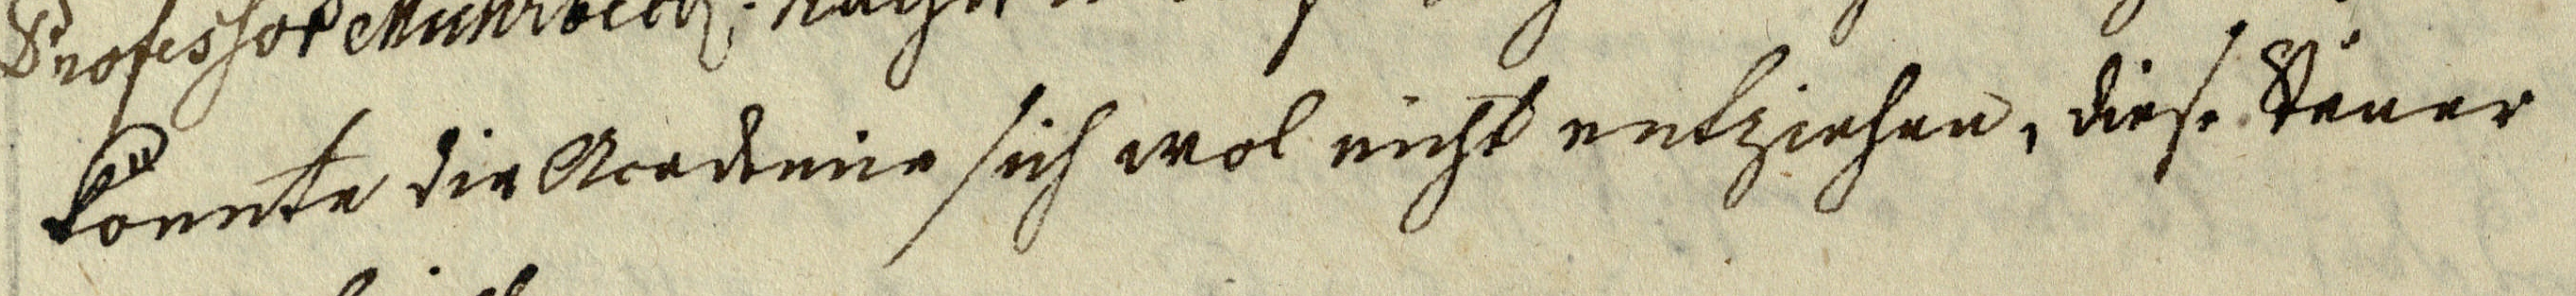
könnte die Academie sich wohl nicht entziehen, diese Steuer
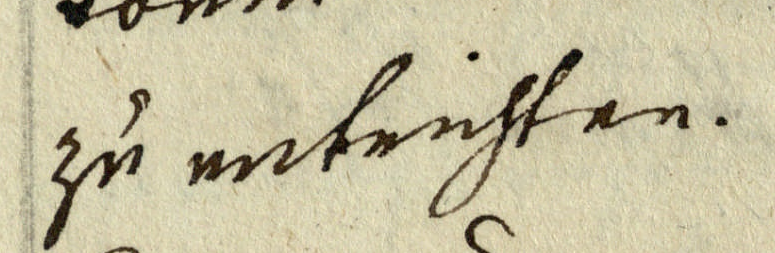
zu entrichten.
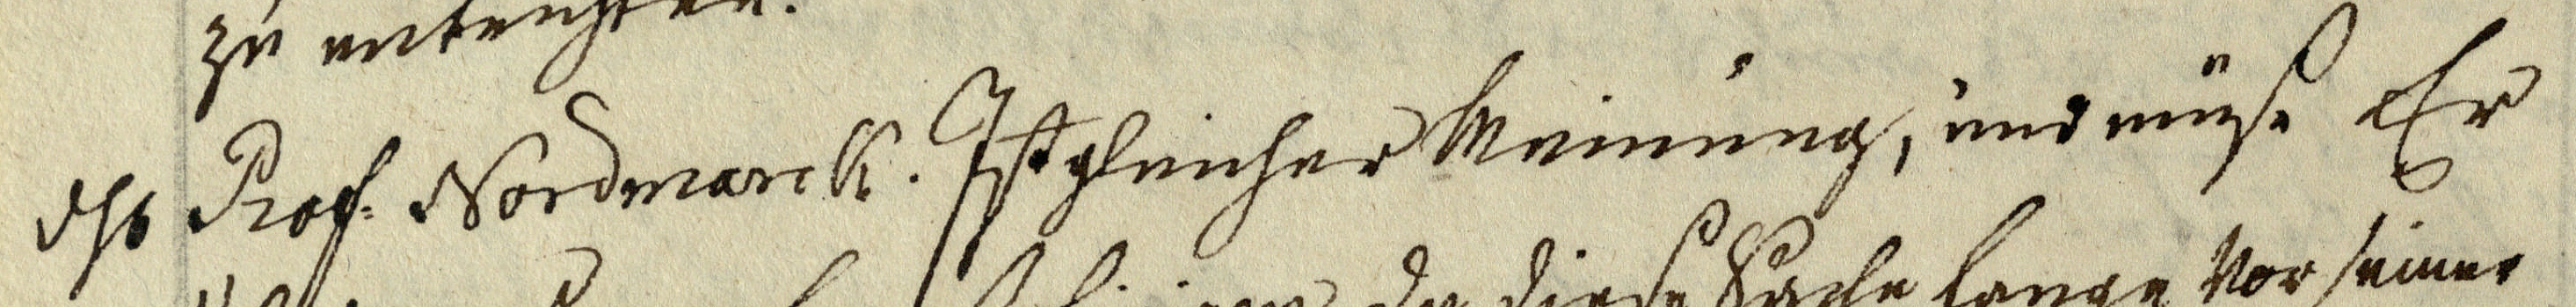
dh. Prof. Nordmarck. Ist gleicher Meinung, und müsse Er
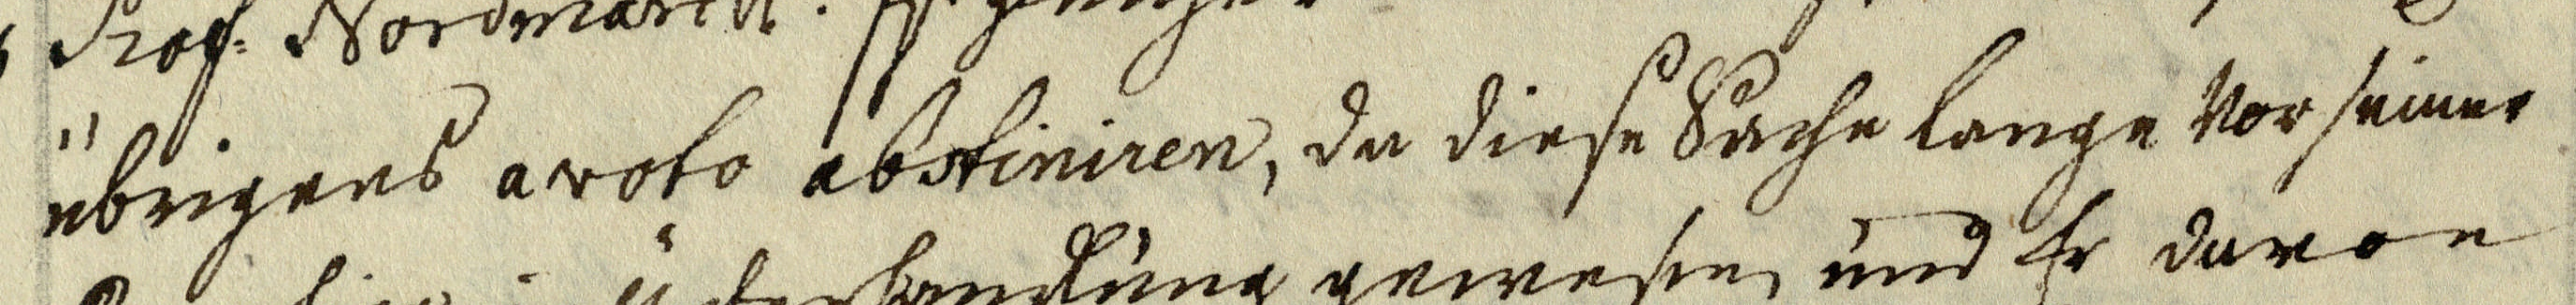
übrigens a voto abstiniren, da diese Sache lange vor seiner
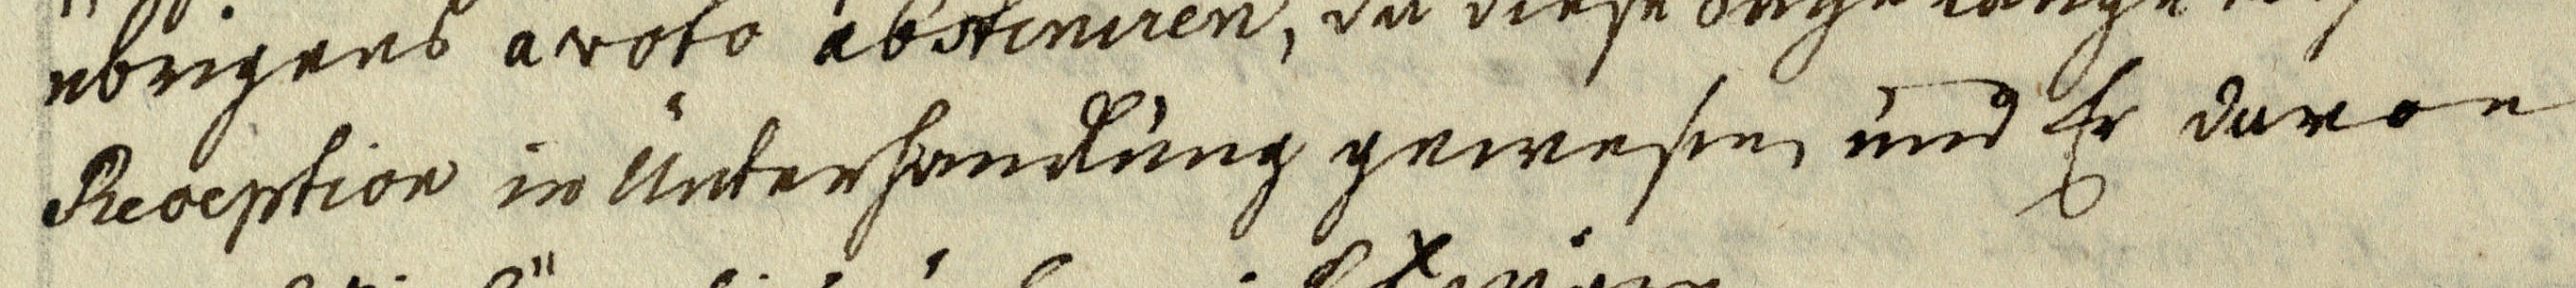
Reception in Unterhandlung gewesen, und Er davon
